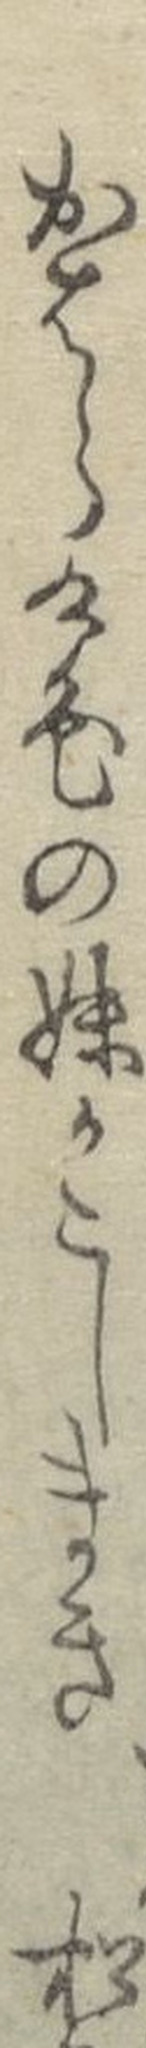かはらけ色の妹かこしまき五葉園

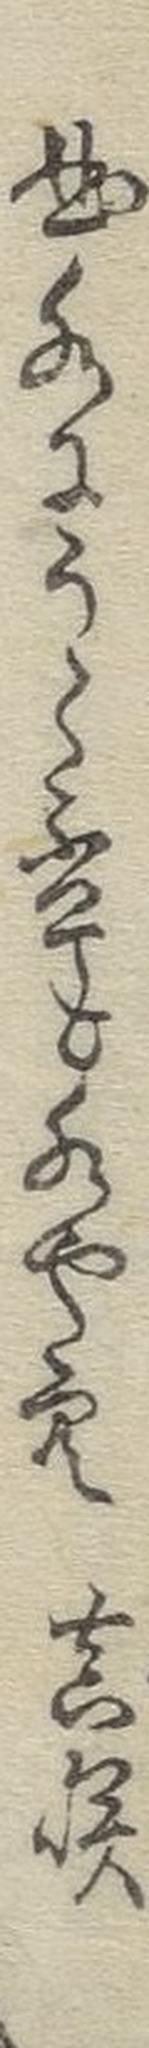曲水にうく盃も水や空花垣
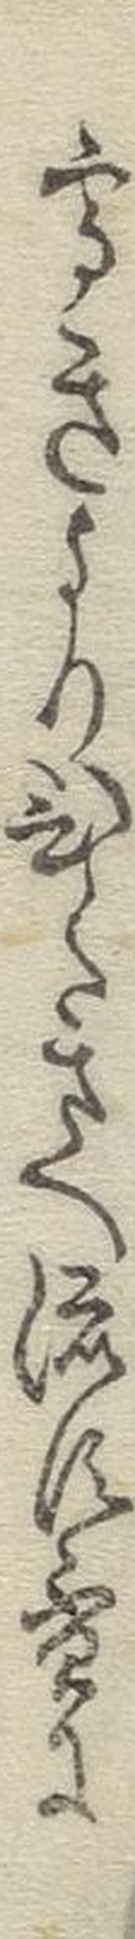高きよりひくきへ流す盃に
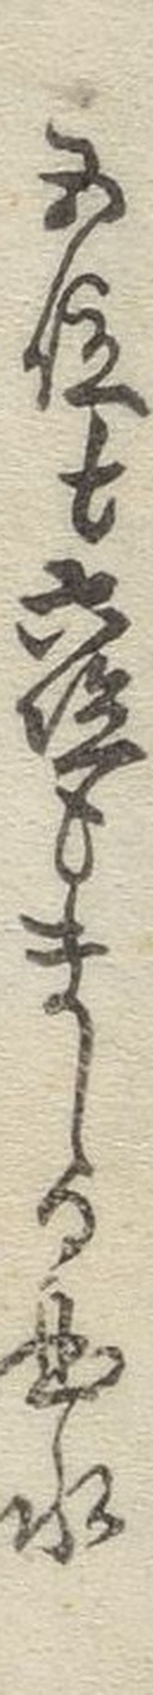五位も六位もましる曲水
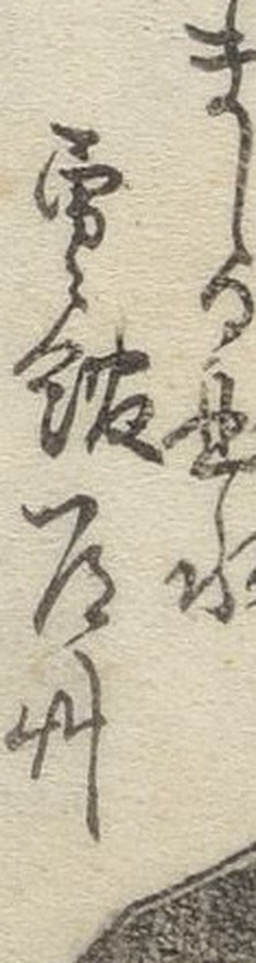勇々館道草
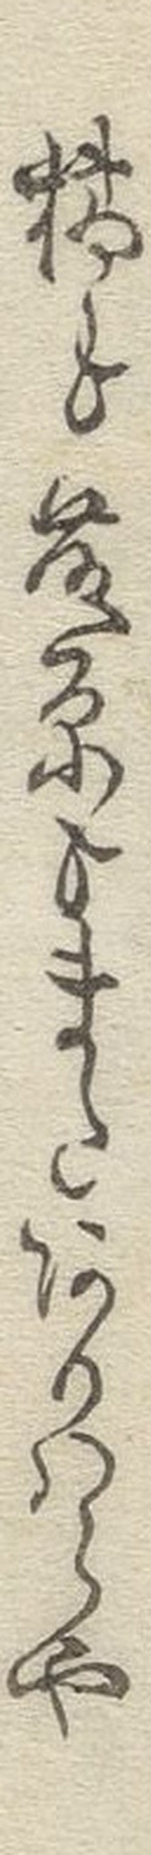橘も藤原もまたありはらや
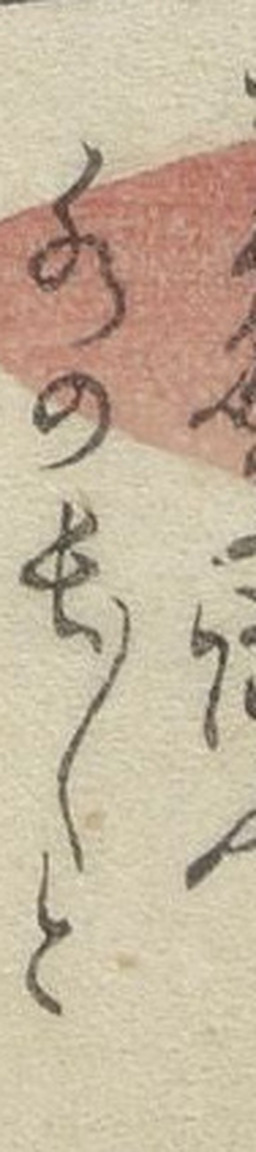みずの長〳〵と
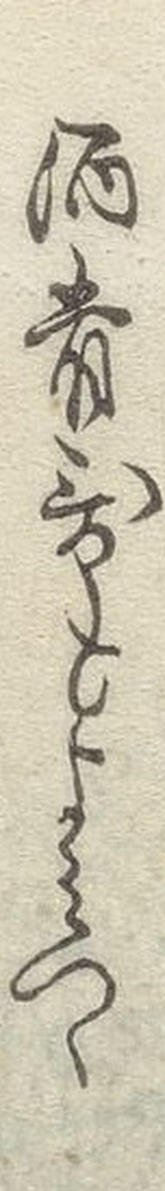酒肴哥もよみつゝ
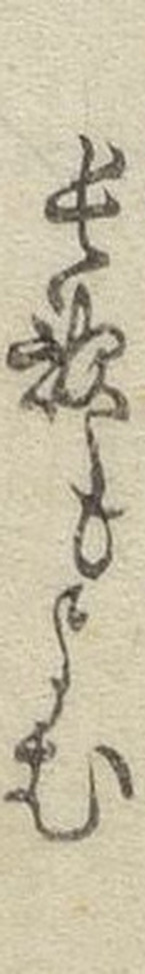長歌もよむ
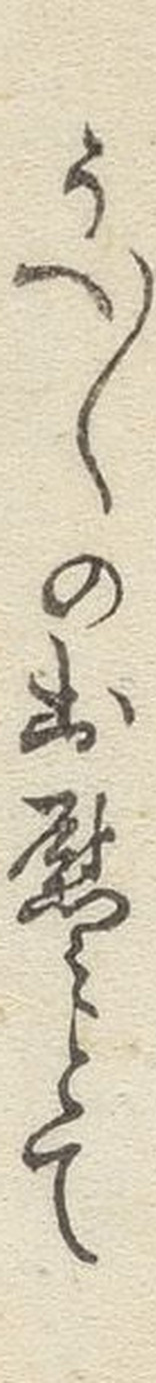うへ〳〵のお慰みとて
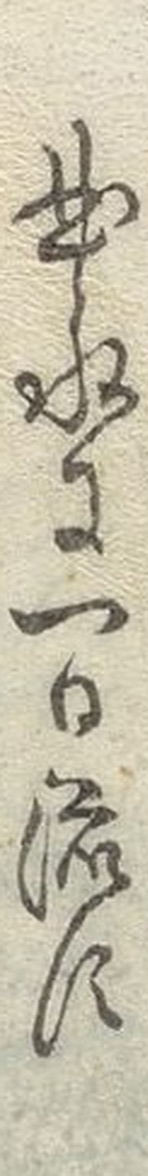曲水に一日流す
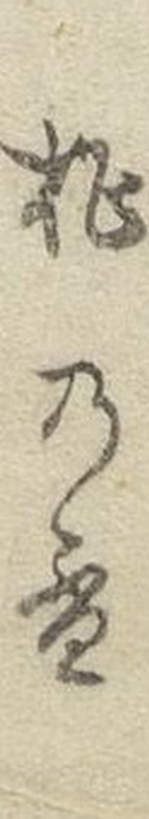桃の盃
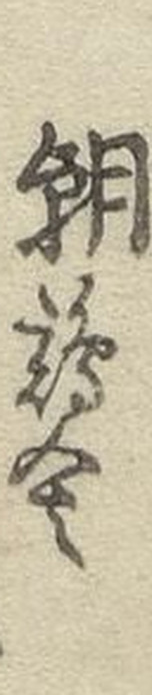朝鶴舎
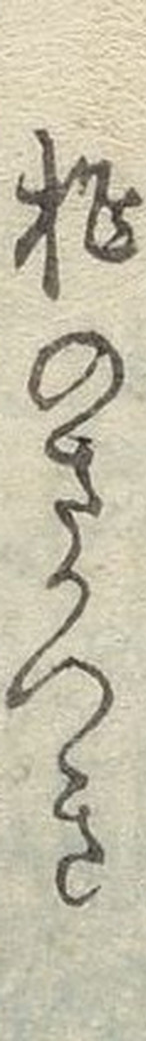桃のさかつき
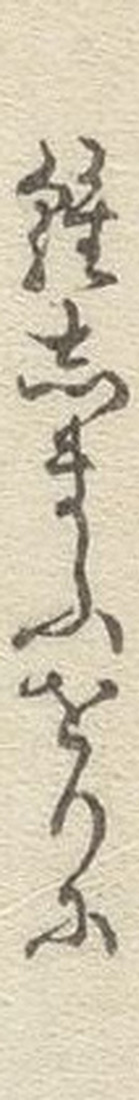雛しまふをりに
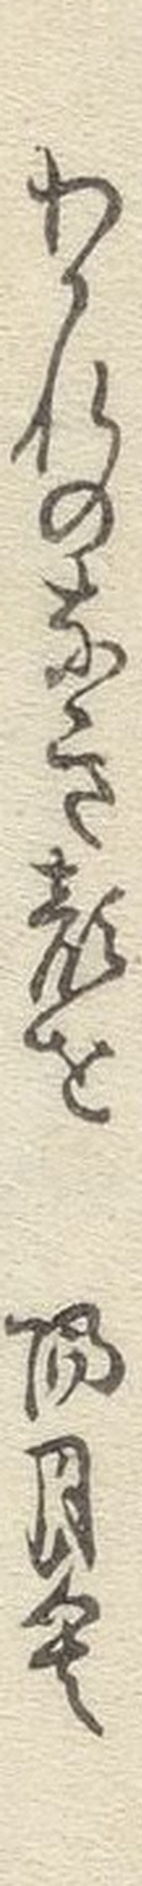わかれのなき顔を陽月舎
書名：Picture Album of People with Kyōka (Light Verse) (Kyōka shiki jinbutsu 狂歌四季人物)
